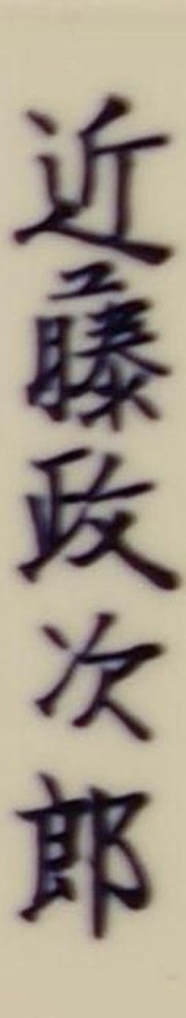近藤政次郎
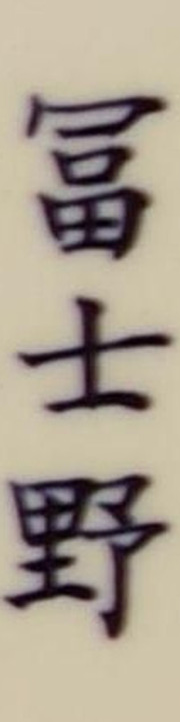冨士野
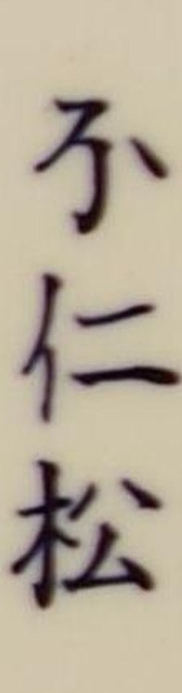不仁松
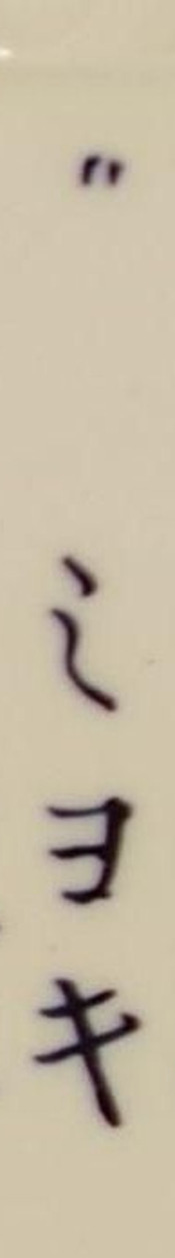ミヨキ
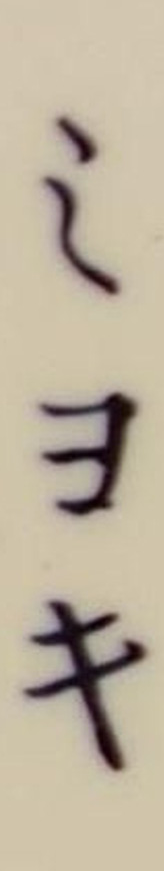ミヨキ
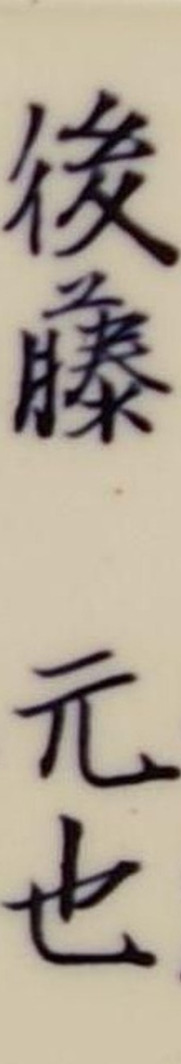後藤元也
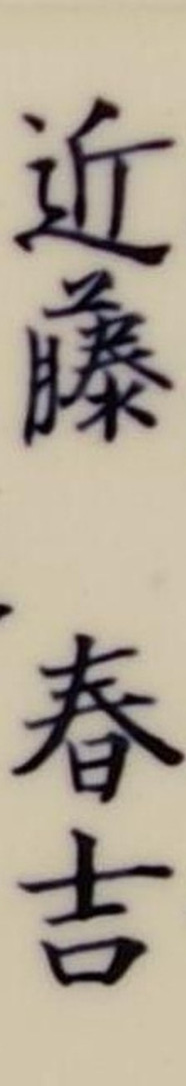近藤春吉
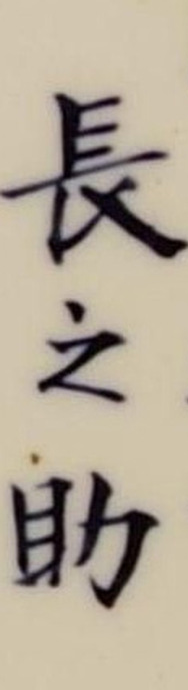長之助
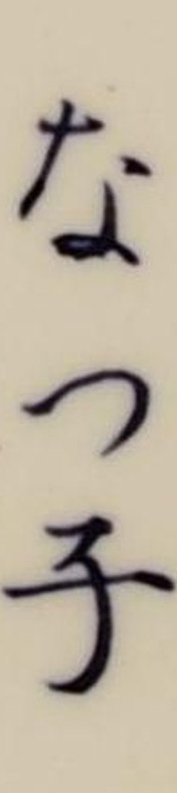なつ子
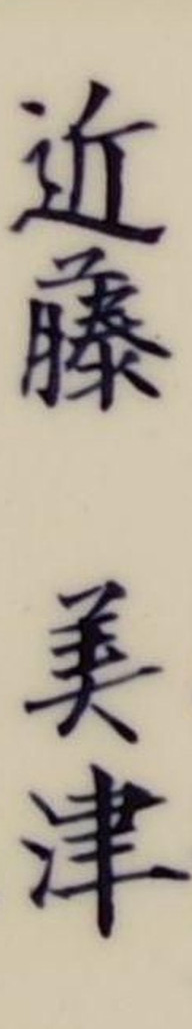近藤美津
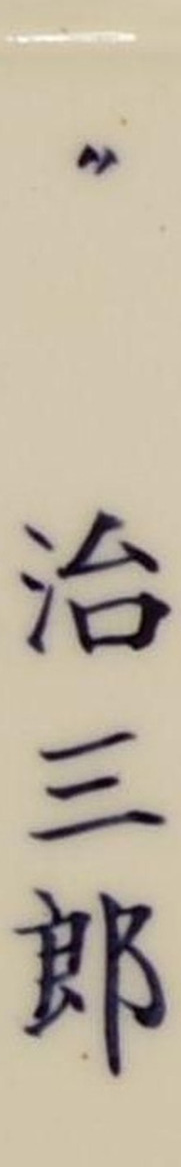治三郎
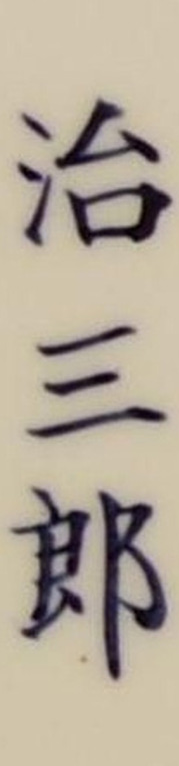治三郎
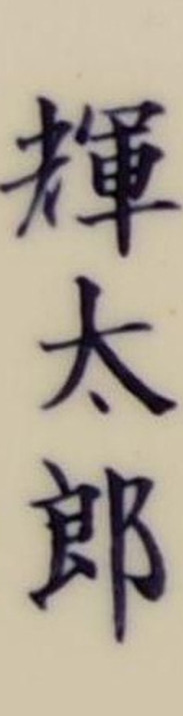輝太郎
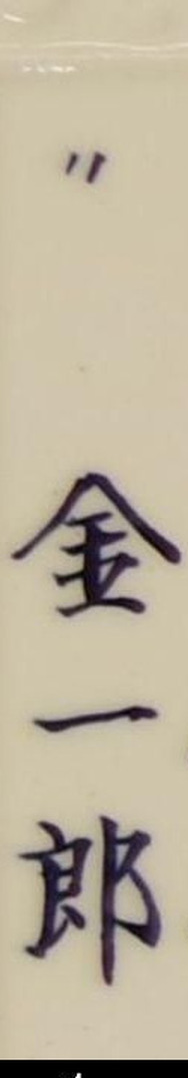金一郎
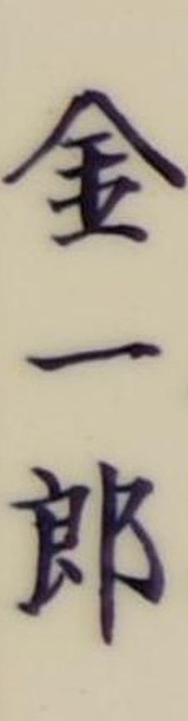金一郎

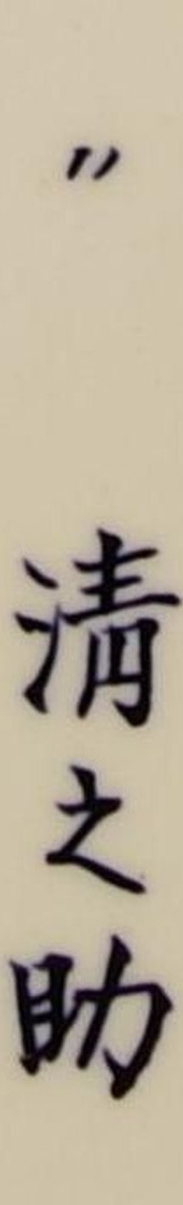清之助
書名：E~L
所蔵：高野山金剛峯寺
